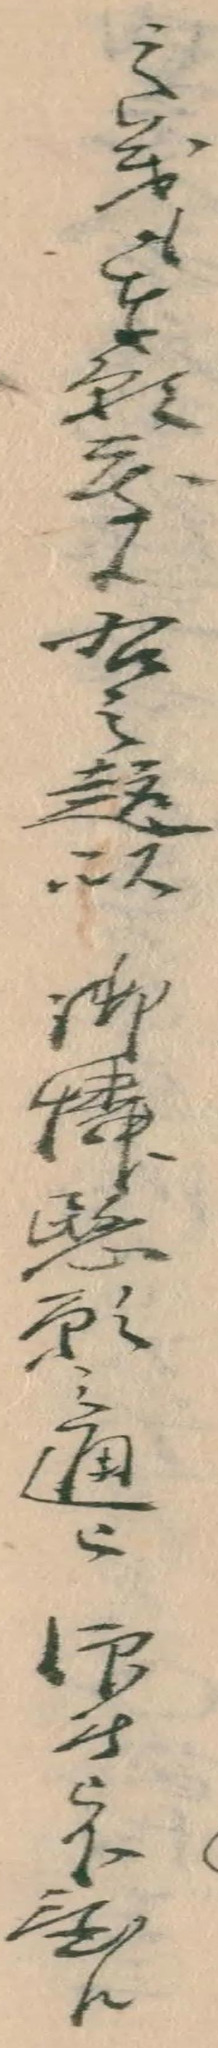之義も奉願處右之趣以御憐愍願之通被仰付被下置候
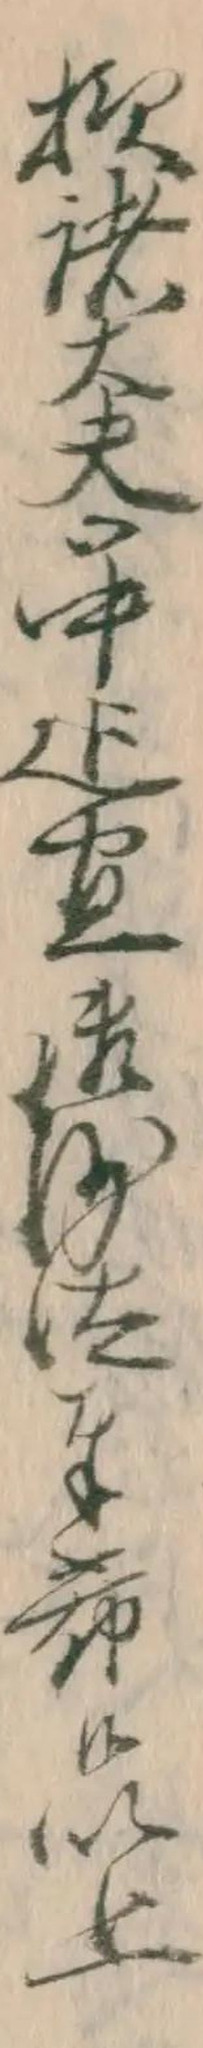様諸大夫御中迄宜御沙汰奉希候以上
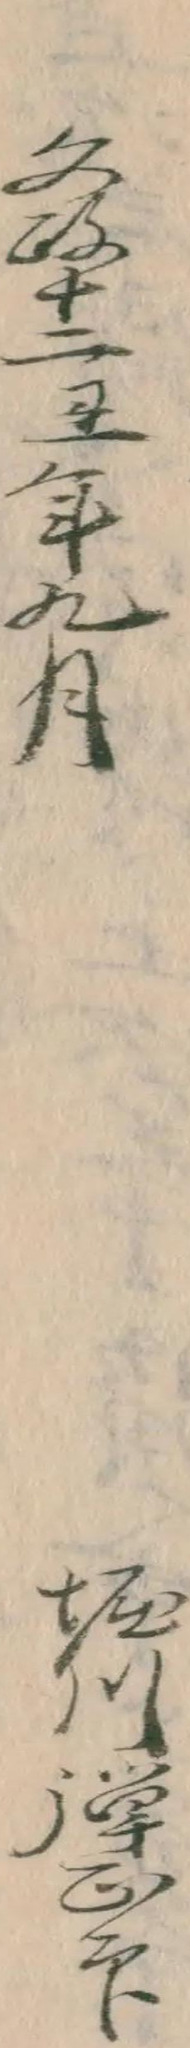文政十二丑年九月堀川弾正印
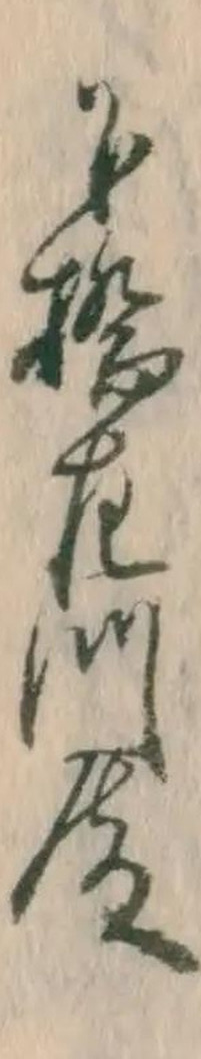下橋左門殿
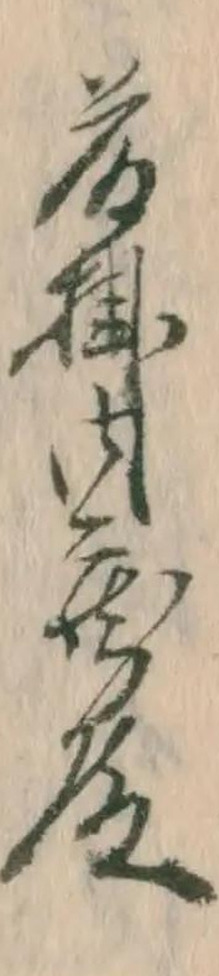藤掛内蔵殿
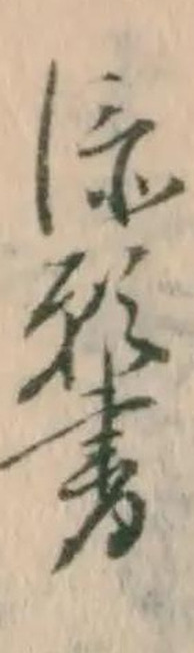添願書
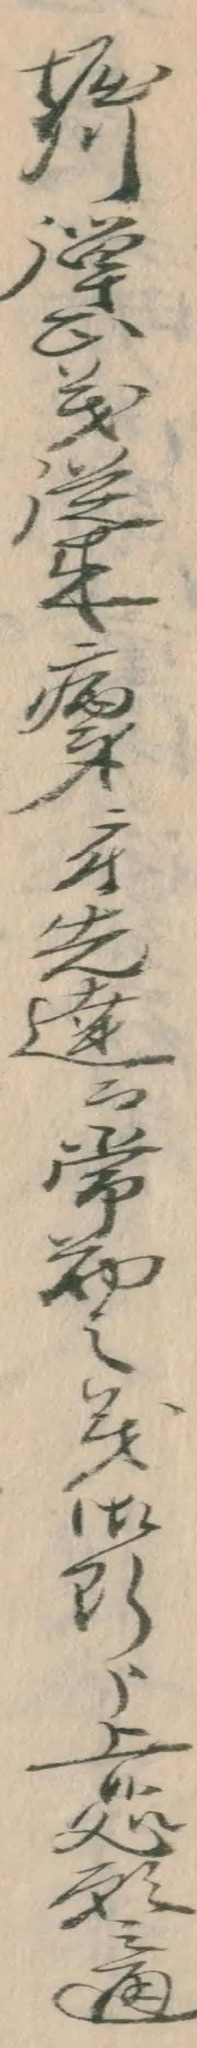一堀川弾正義従来病身ニ付先達而常勤之義御断申上候処願之通
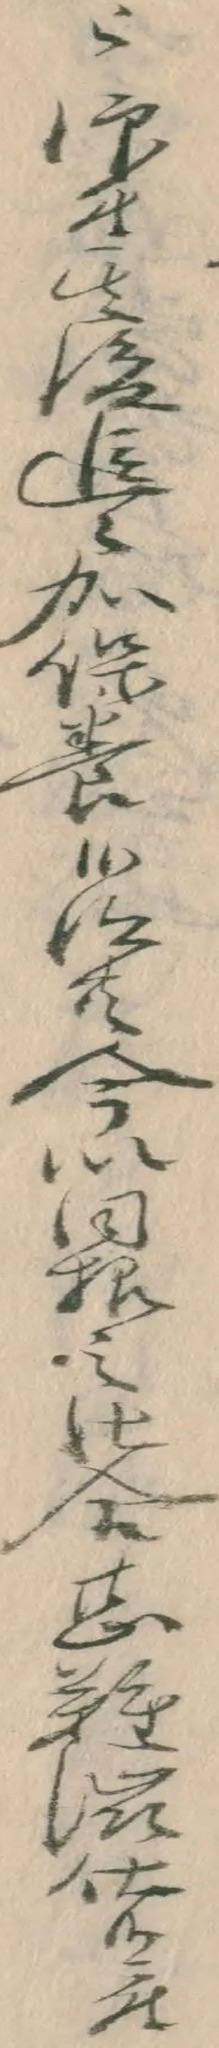被仰付其後追々加保養候得共今以同様之仕合甚難渋仕候に付
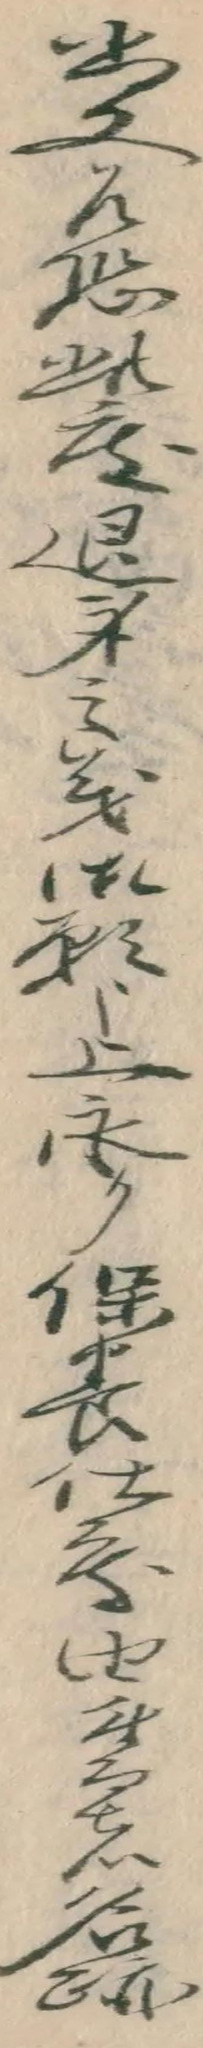尚又乍恐此度退身之義御願申上永ク保養仕度由付而者名跡
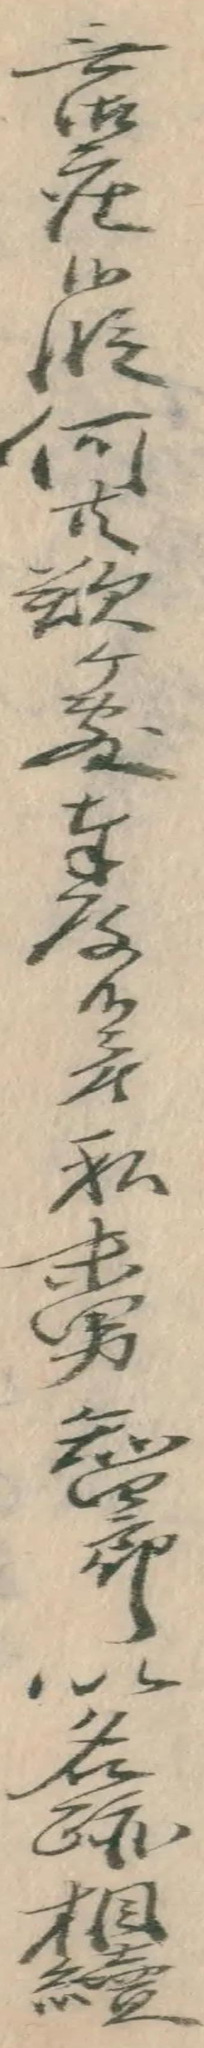無御座候段何共歎ヶ敷奉存候ニ付私末男知四郎以名跡相續
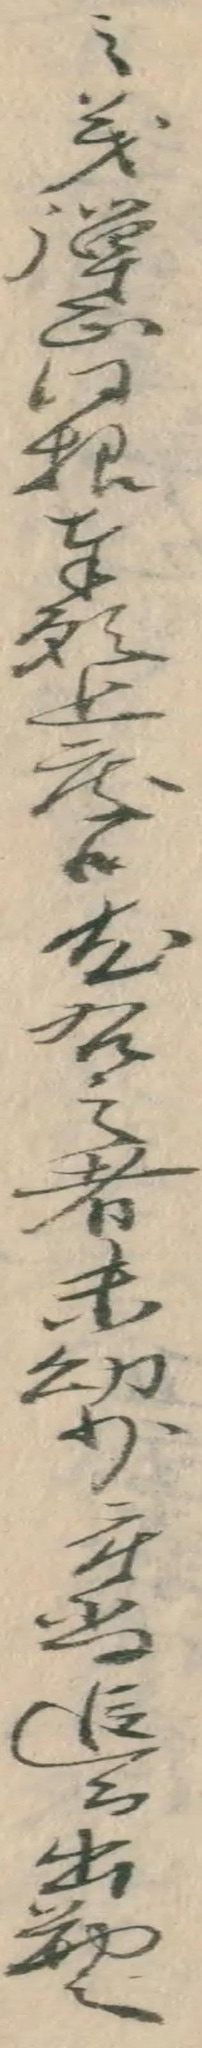之義弾正同様奉願上度候尤右之者未幼少ニ付尚追而出勤之
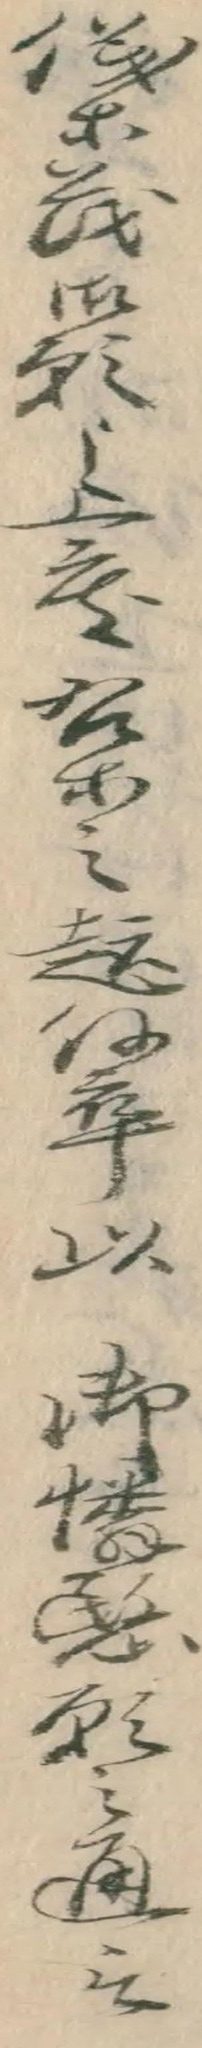儀等も御願申上度右等之趣何卒以御憐愍願之通被

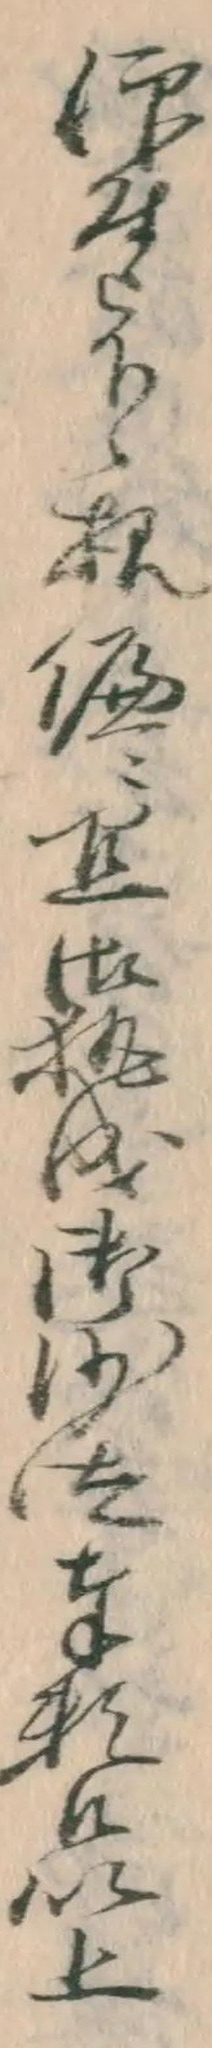仰付被下候様偏ニ宜御執成御沙汰奉頼候以上
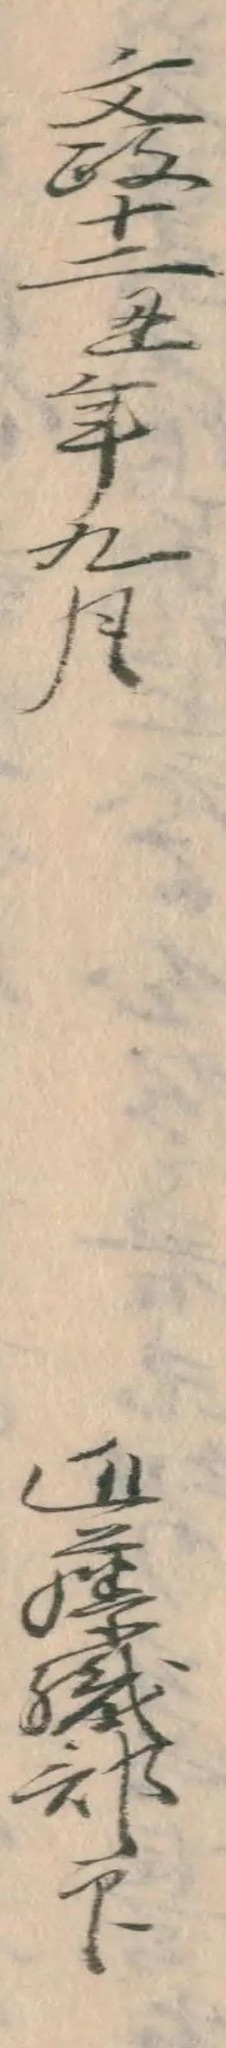文政十二丑年九月近藤織部印
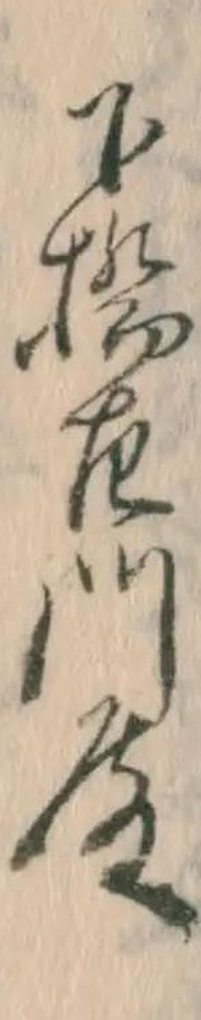下橋左門殿
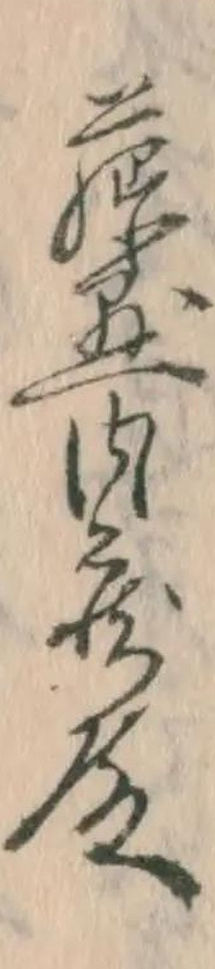藤懸内蔵殿
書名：賀茂社記録. 第65冊
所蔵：国立国会図書館 National Diet Library, JAPAN
